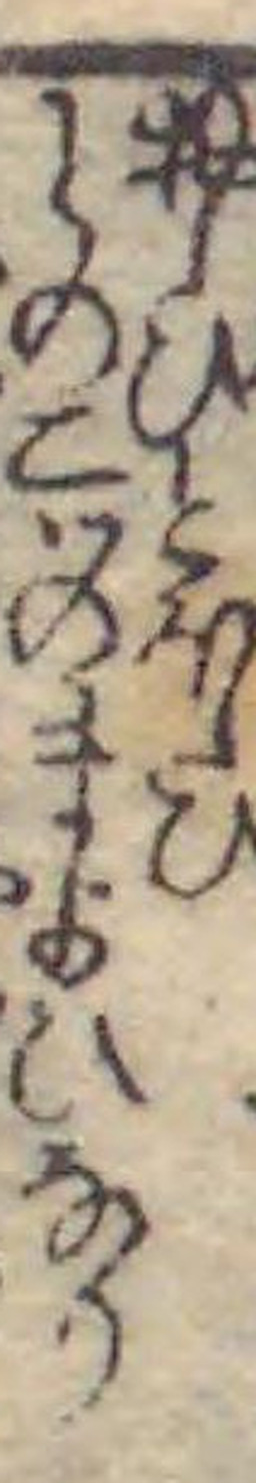との二つのまよひなり
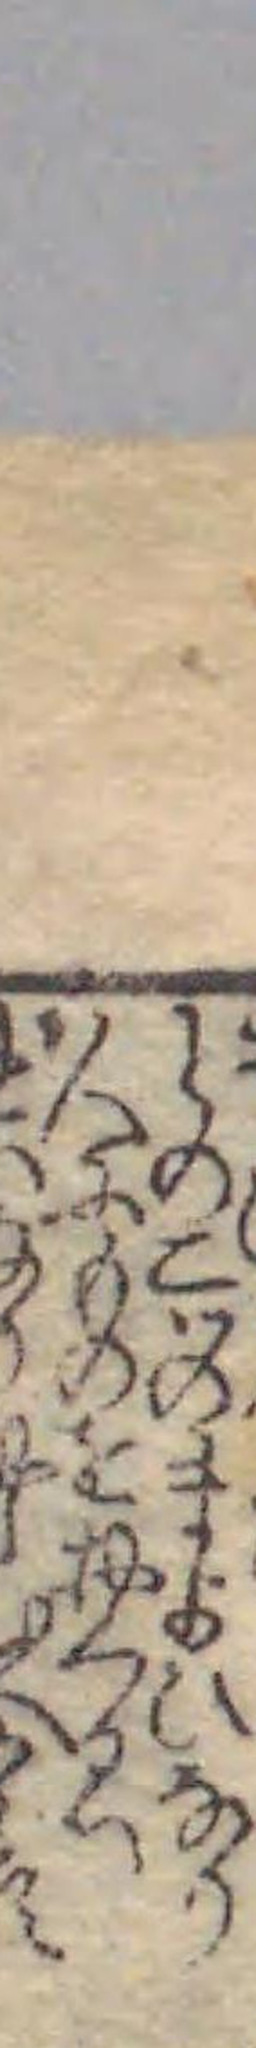人にものをおくるは
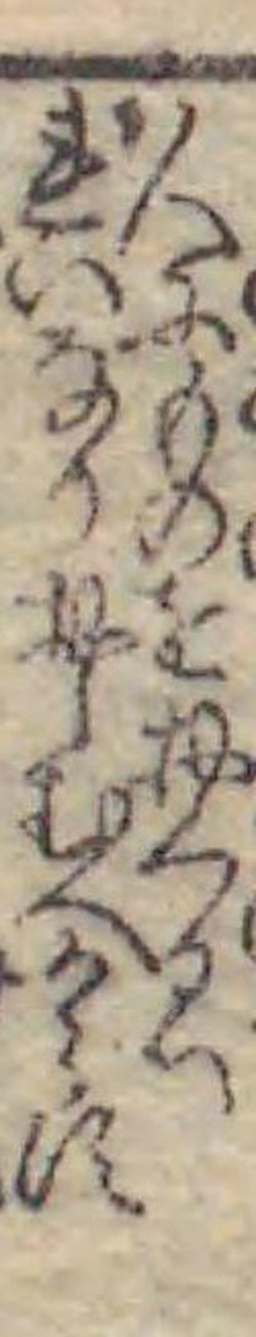れいなりおしむへからす
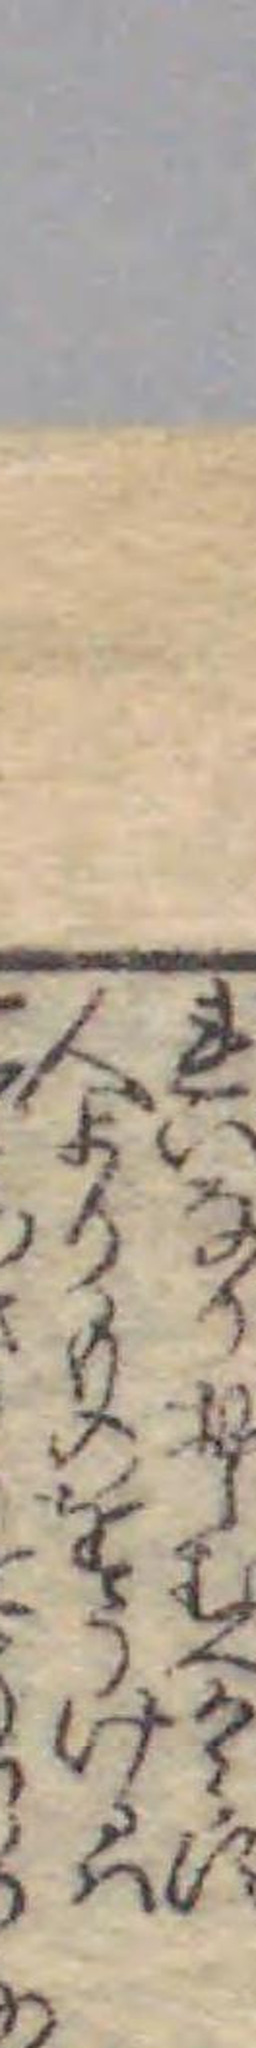人にものをおくるは
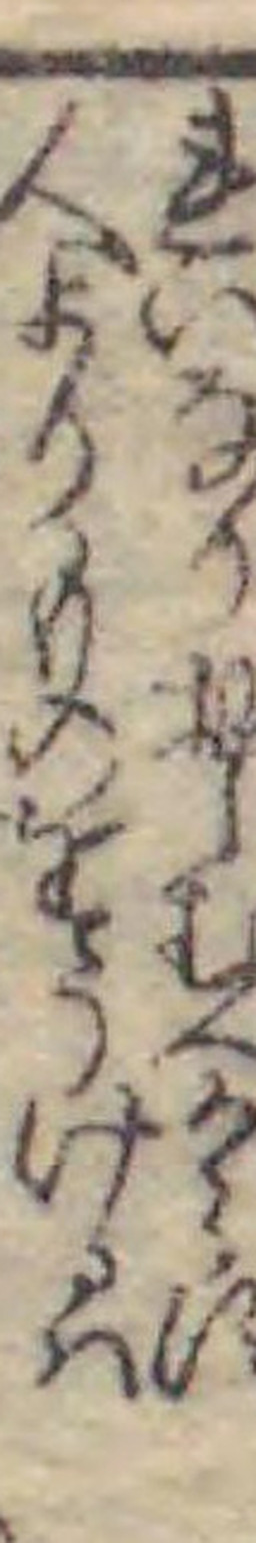人にものをおくるは
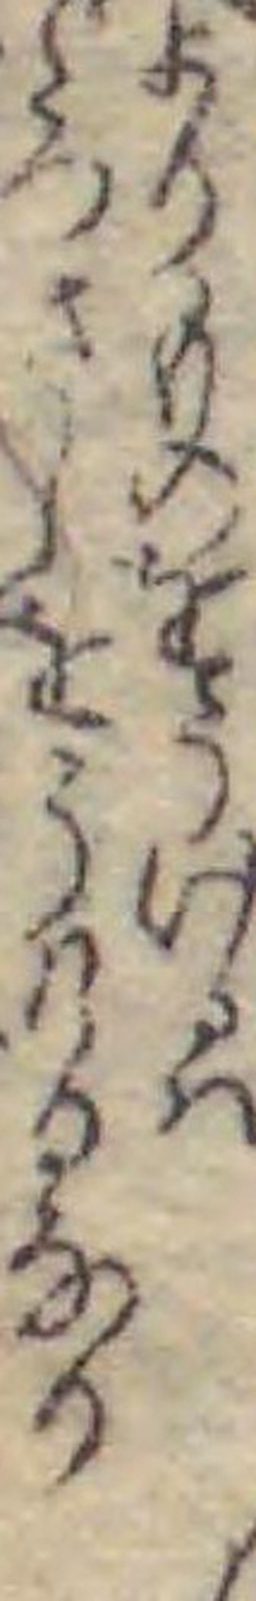こゝろさしをうけるはり
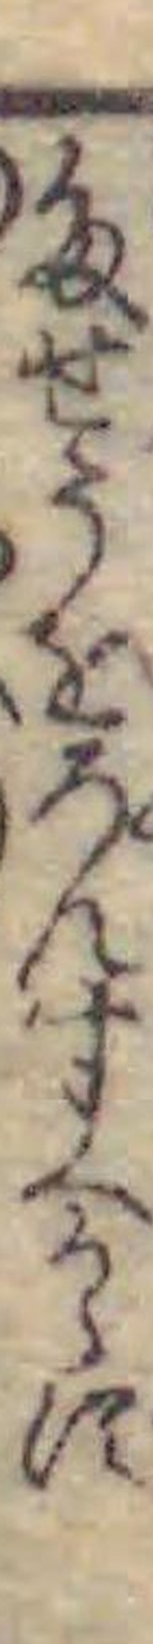たせうをろんすへからす

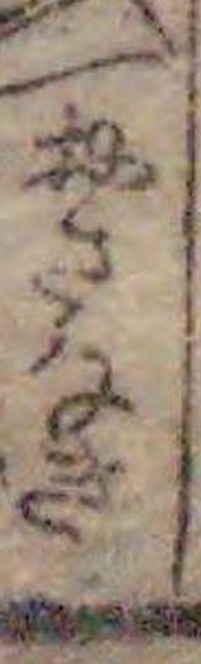おさなき
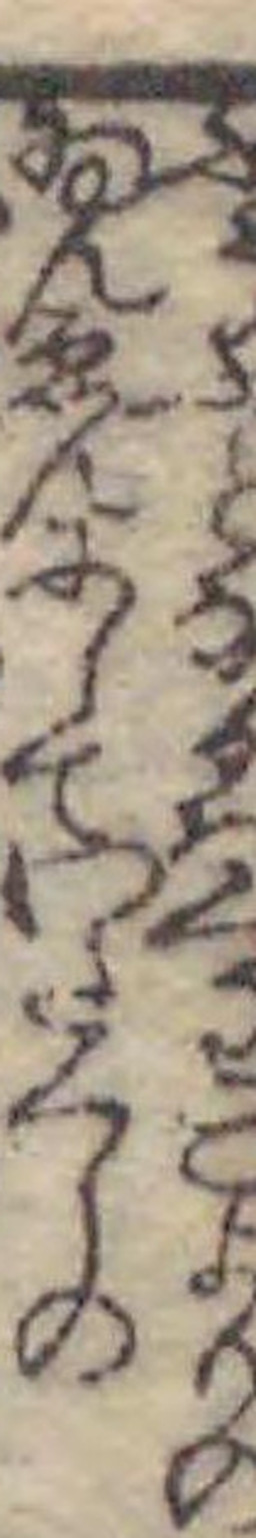ゐんゑんにしてわたくしの
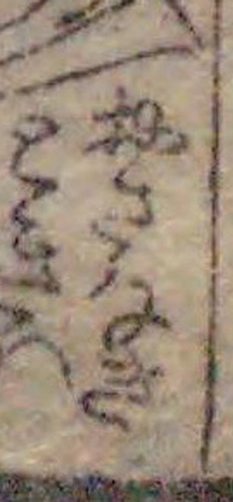おさなき
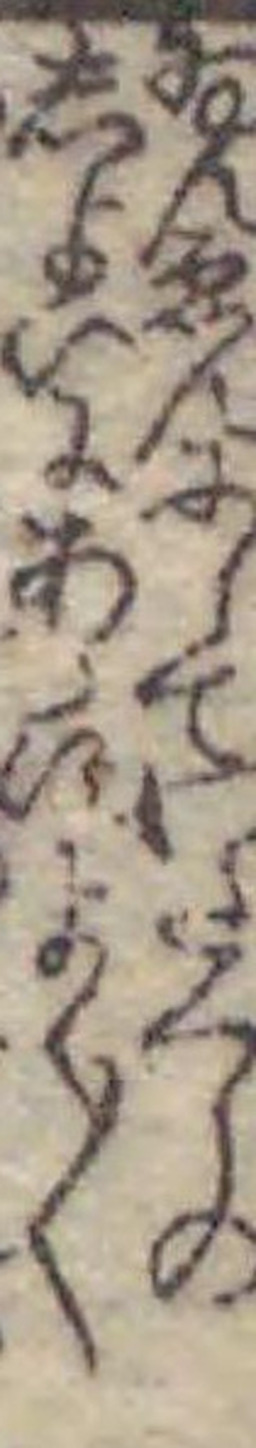しよいにあらすよく〳〵
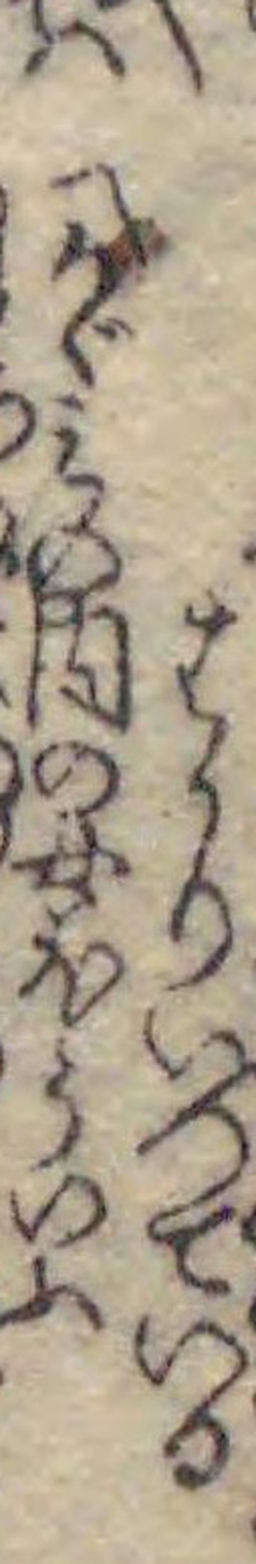〽かゞみの内の女ほういふ
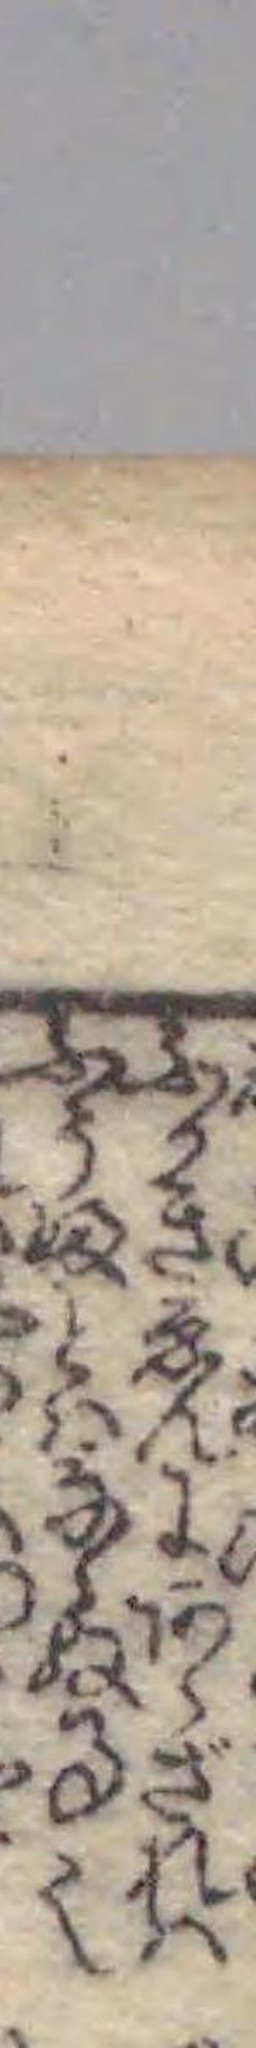ふうふとはならぬ事也
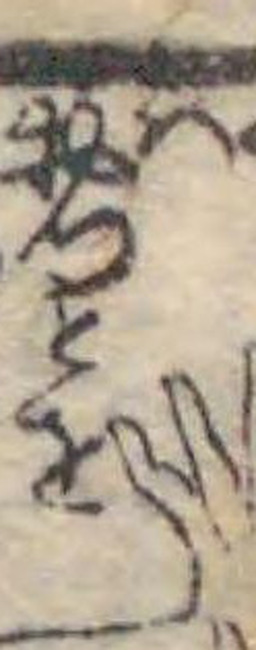おつとを
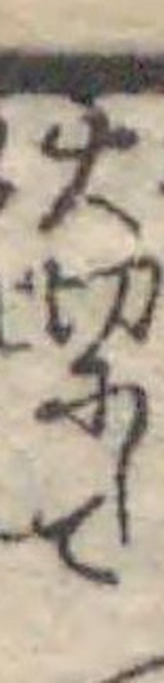大切にして
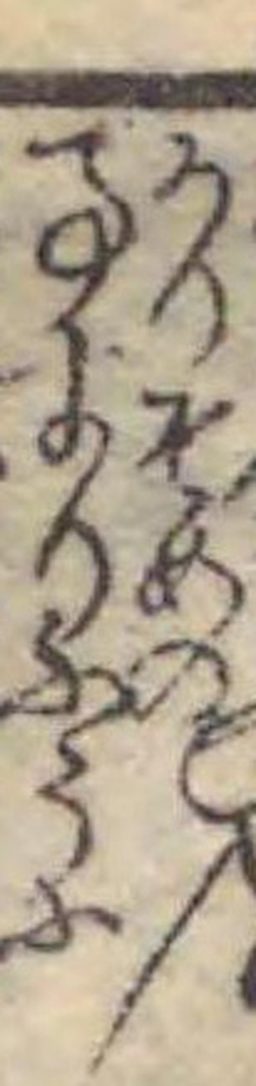事よりふうふ
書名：人心鏡写絵 : 3巻
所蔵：国立国会図書館 National Diet Library, JAPAN
